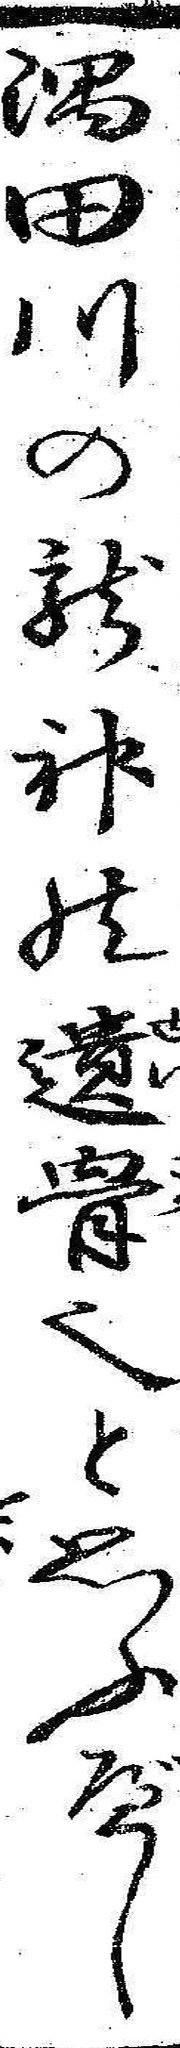隅田川の竜神の遺骨也と思ふべし
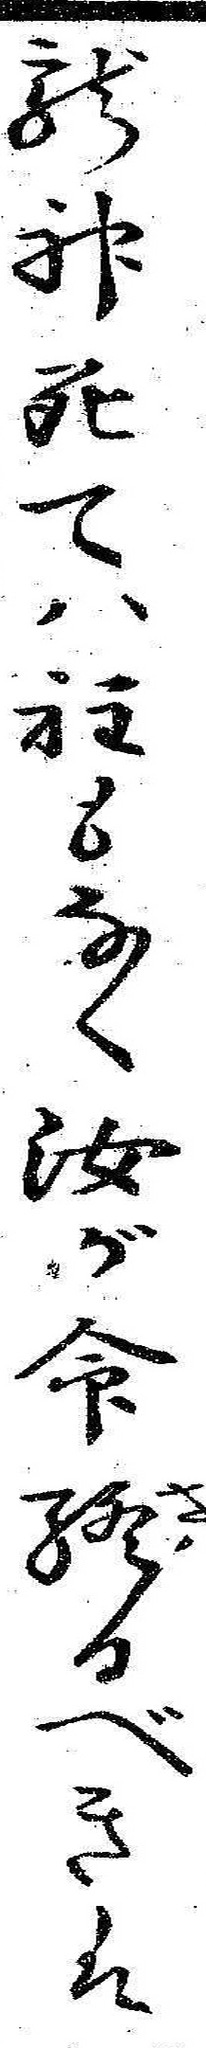竜神死ては程もなく汝が命終るべきは
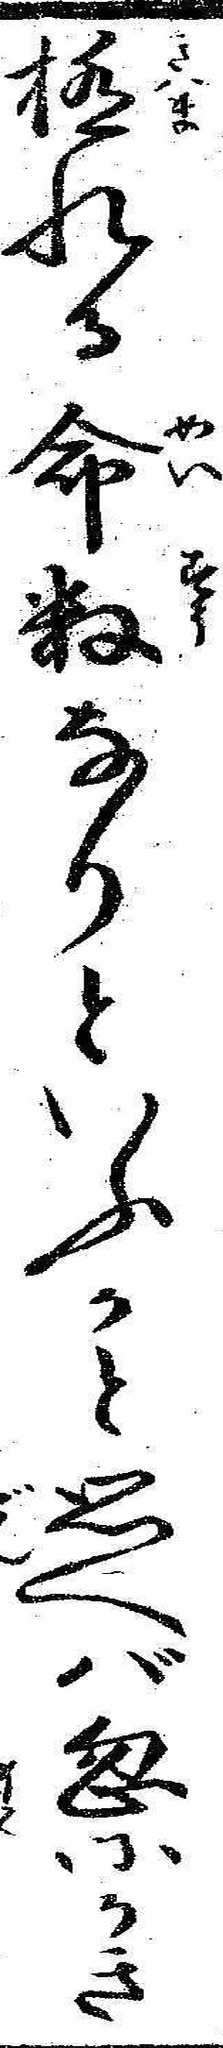極れる命数なりといふかと思へば忽にかき
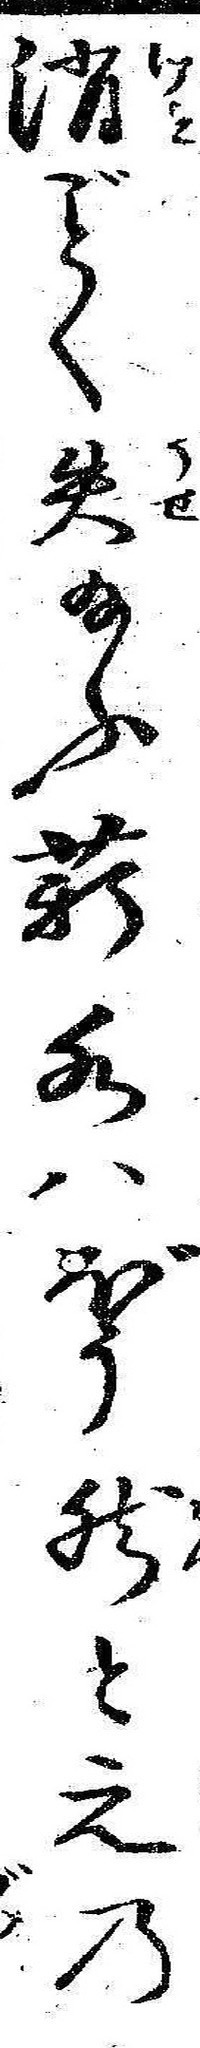消ごとく失給ふ薪水はぼう然と元の
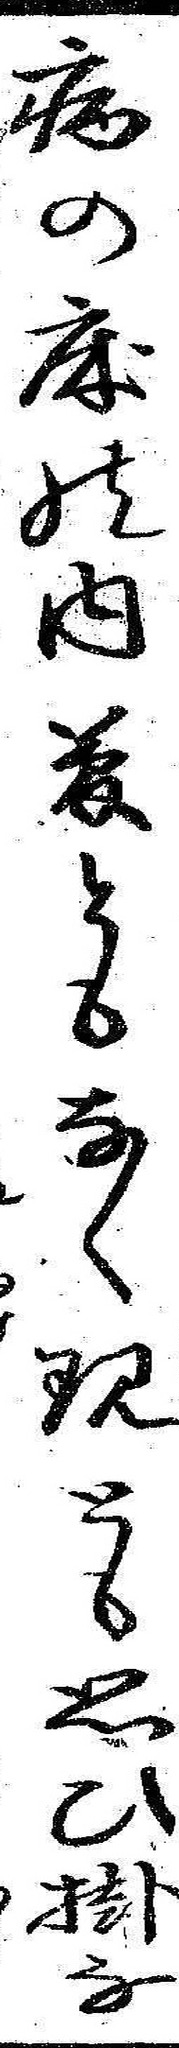病の床の内夢ともなく現とも思ひ掛な
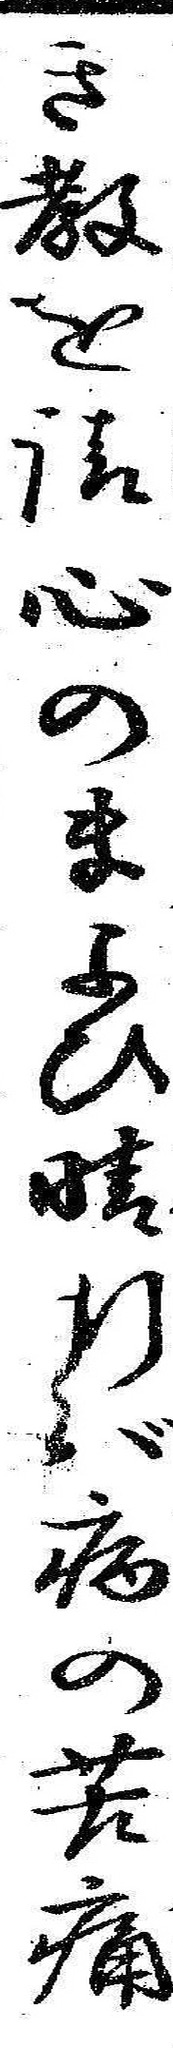き教を請心のまよひ晴行ば病の苦痛
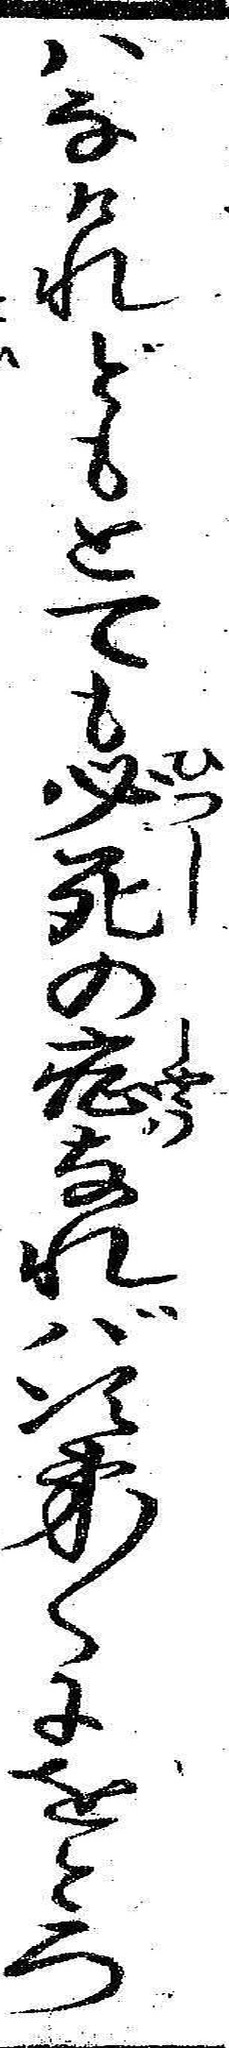はなけれどもとても必死の症なれば次第〱にをとろ
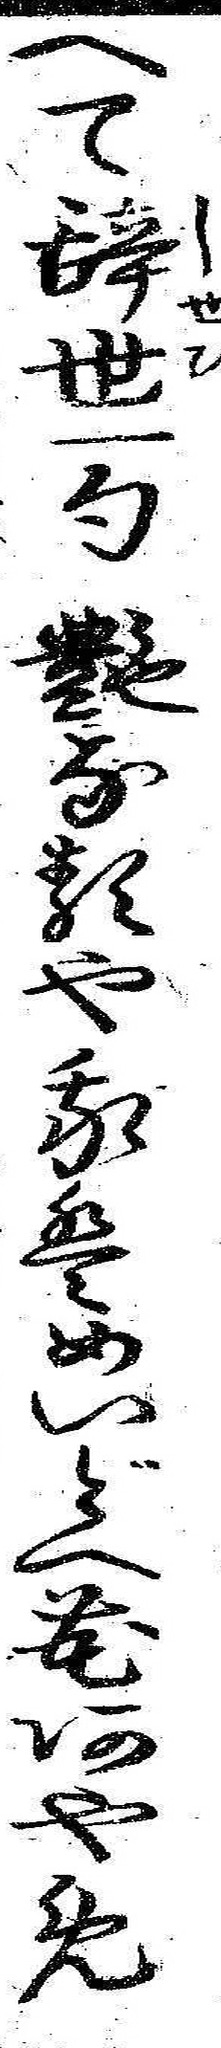へて辞世一句艶なるや我はめいどへ花あやめ
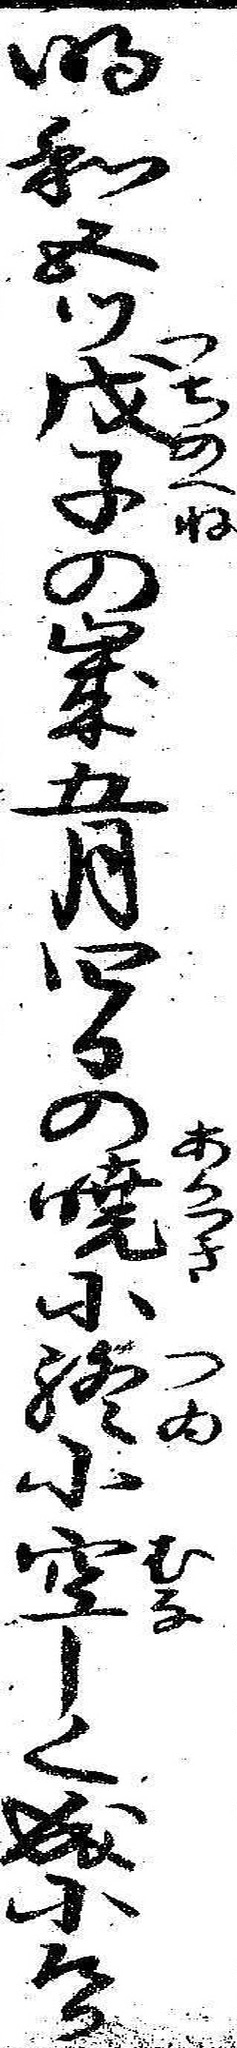明和五ツ戌子の歳五月四日の暁に終に空しく成にけり
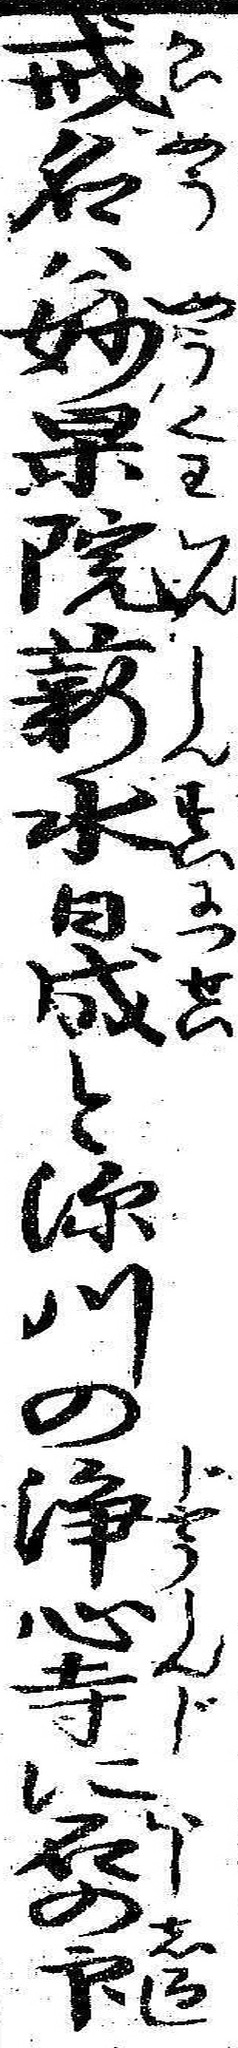戒名は妙果院薪水日成と深川の浄心寺に石の印

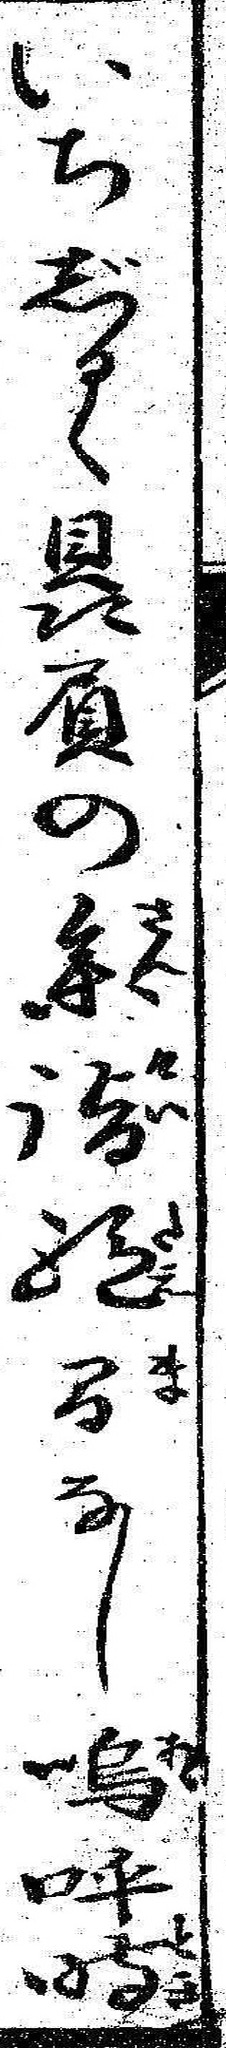いちじるく贔屓の参詣絶間なし嗚呼時
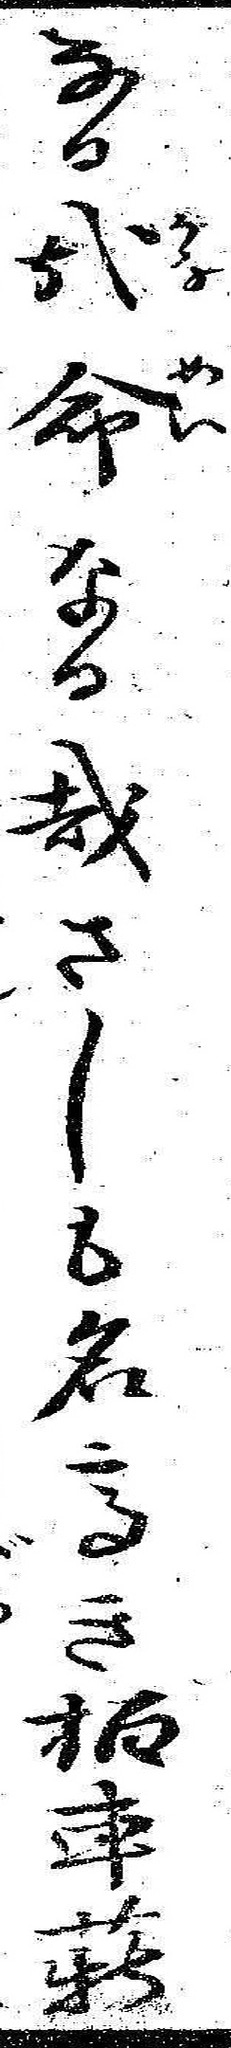なる哉命なる哉さしも名高き栢車薪
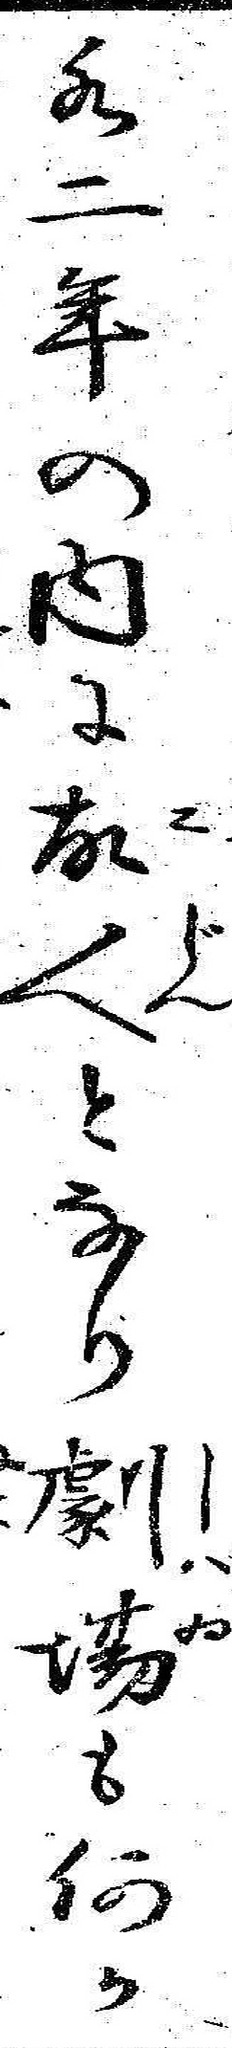水二年の内に故人となり劇場も何か
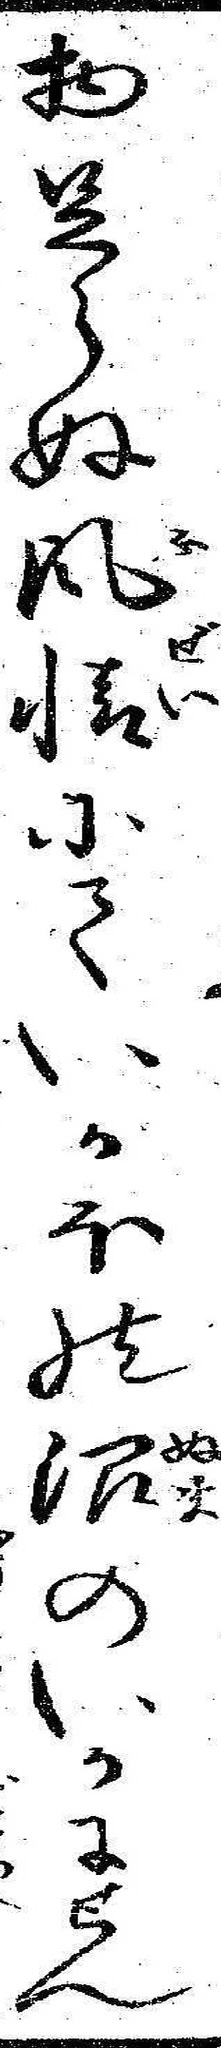物足らぬ風情にていかほの沼のいかにせん
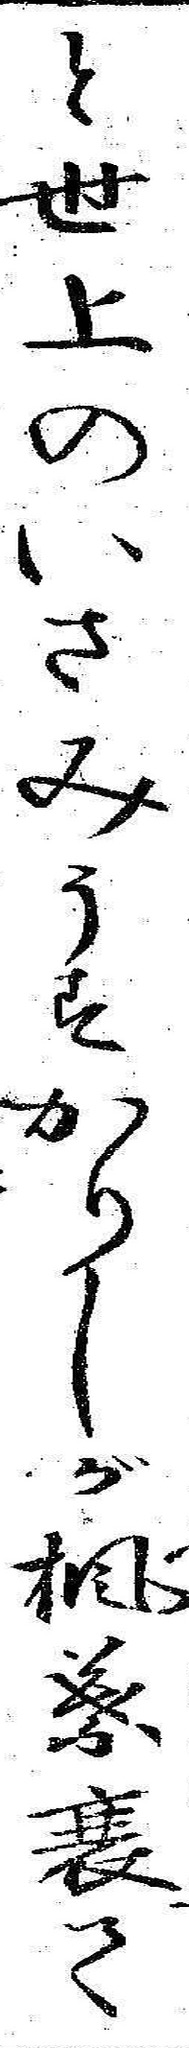と世上のいさみうすかりしが楓葉衰て
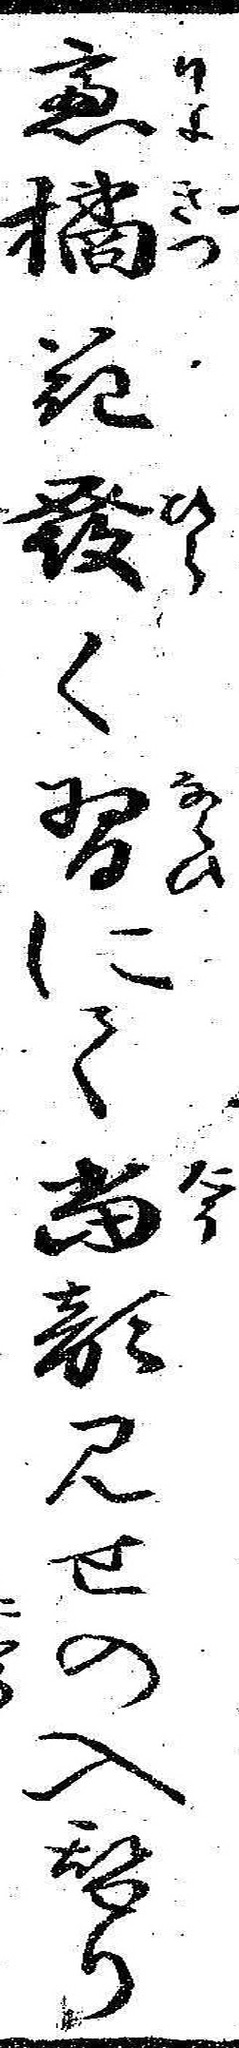慮橘花発く習にて当顔見せの入替り
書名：根無草後編
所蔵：国文学研究資料館
